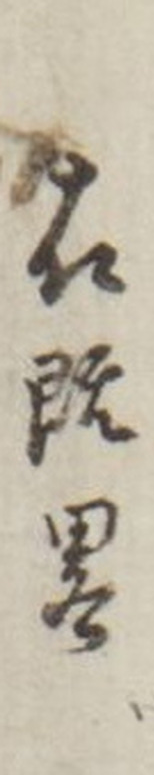右既略
